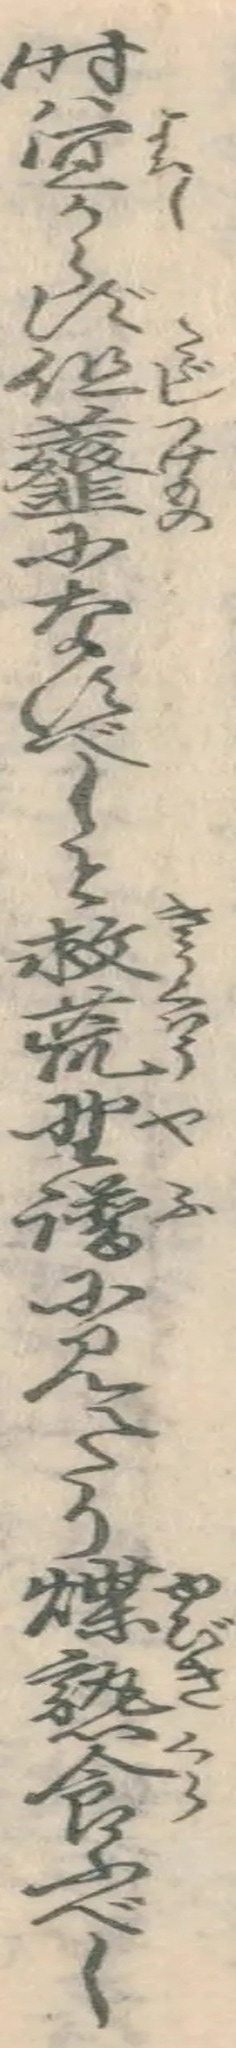時は宜からず但虀になすべしと救荒野譜に見えたり煠熟食ふべし
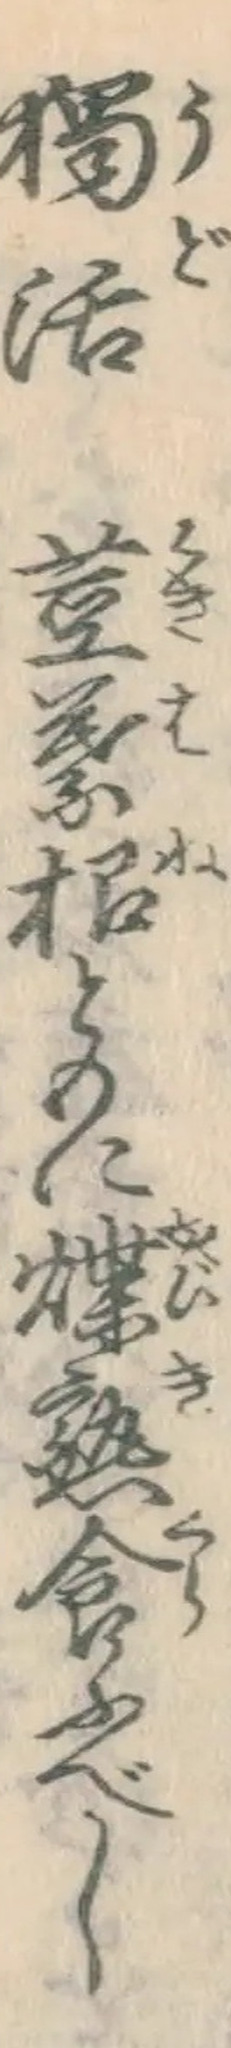独活茎葉根ともに煠熟食ふべし
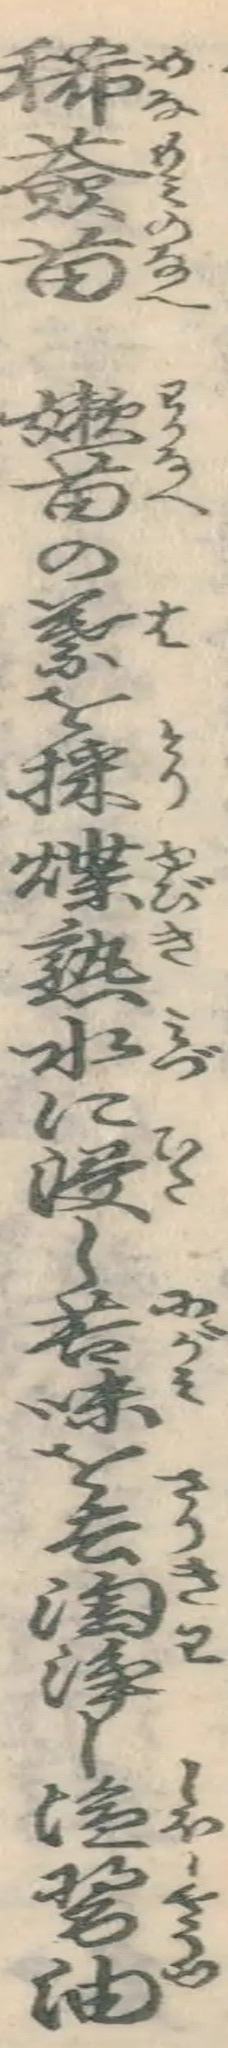稀薟苗嫰苗の葉を採煠熟水に浸し苦味を去淘淨し塩醤油
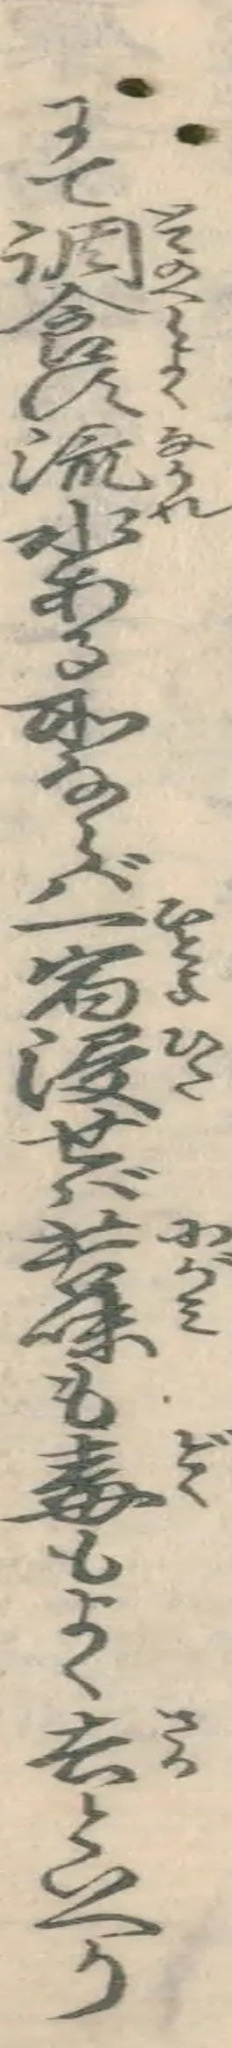にて調食す流水ある所ならば一宿浸せば苦味も毒もよく去といへり
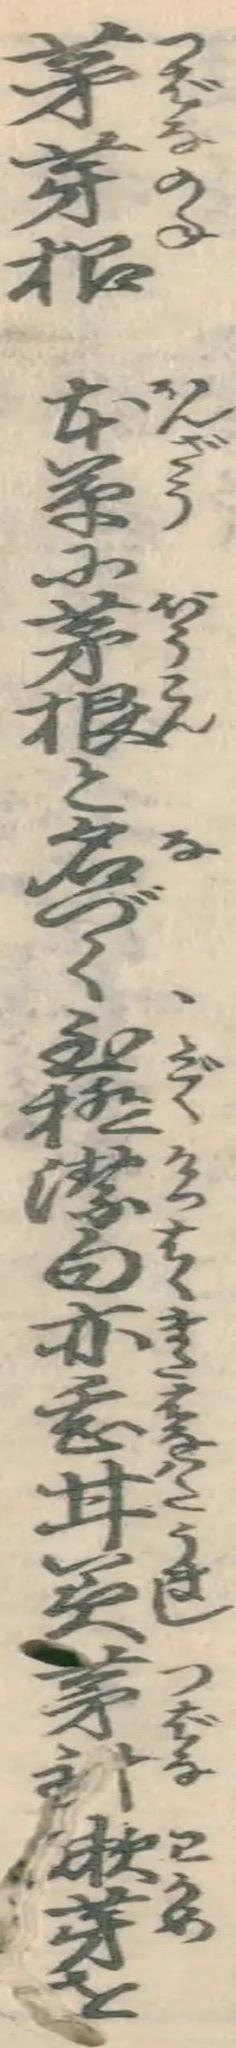茅芽根本草に茅根と名づく至極潔白亦甚甘美茅針嫰芽を

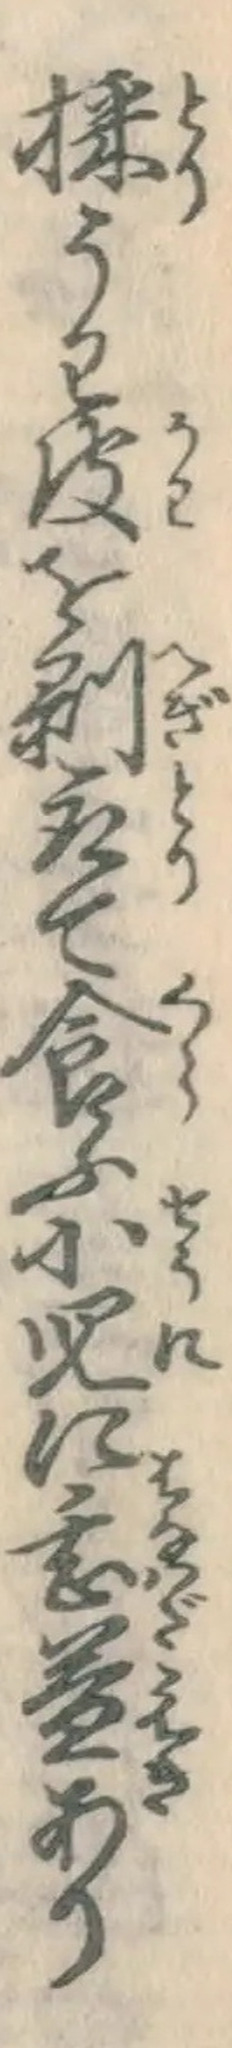採うわ皮を剥取て食ふ小児に甚益あり
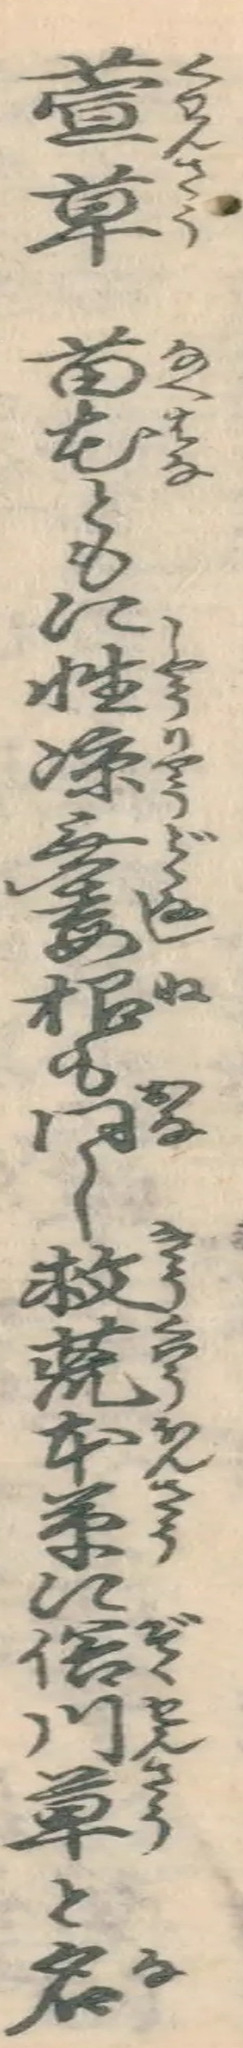萱草苗花ともに性凉無毒根も同し救荒本草に俗川草と名
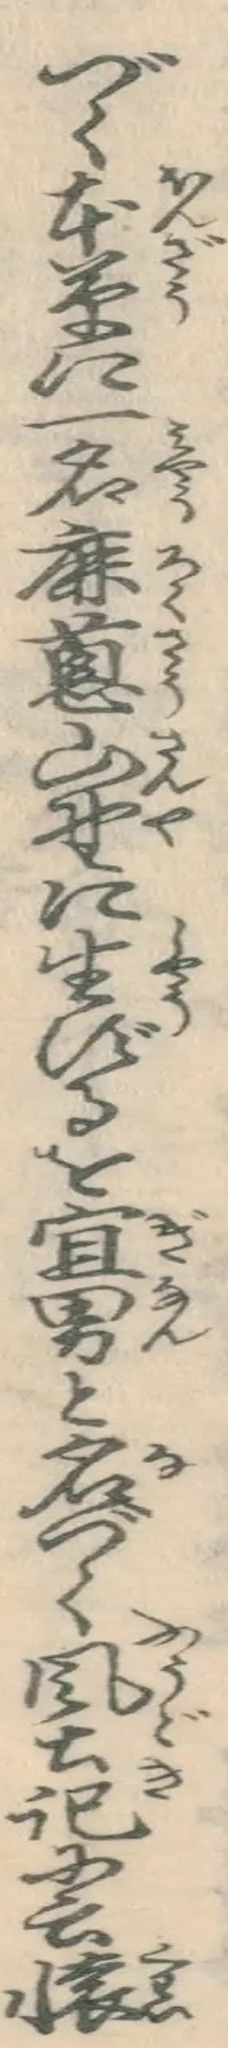づく本草に一名鹿蔥山野に生ずるを宜男と名づく風土記に云懐
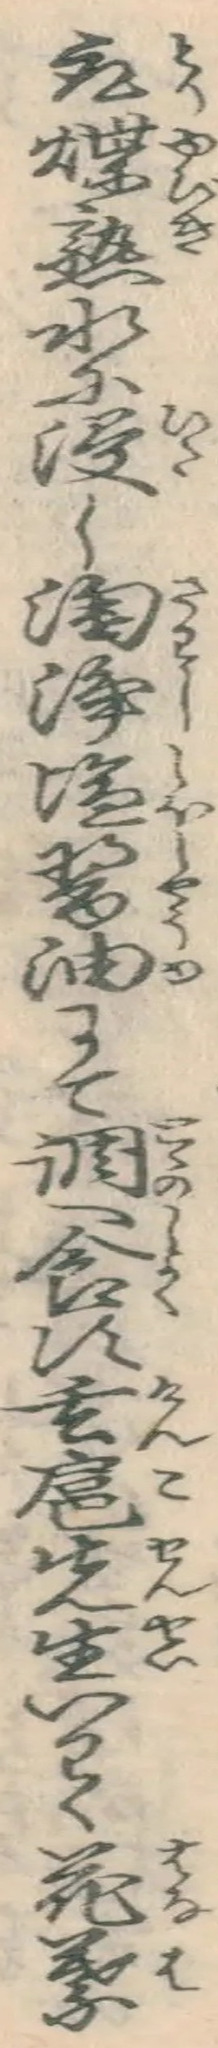取煠熟水に浸し淘浄塩醤油にて調へ食す玄扈先生いわく花葉
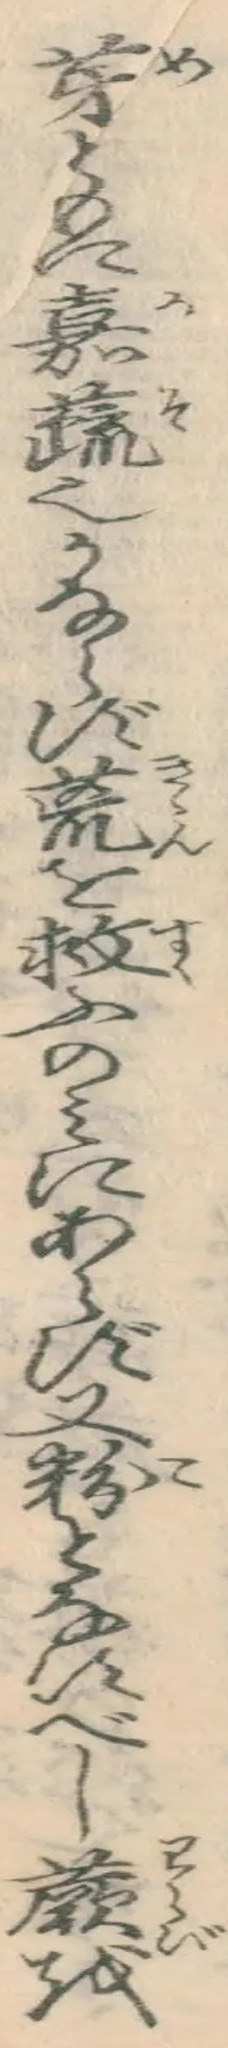芽ともに嘉蔬也かならず荒を救ふのみにあらず又粉となすべし蕨を
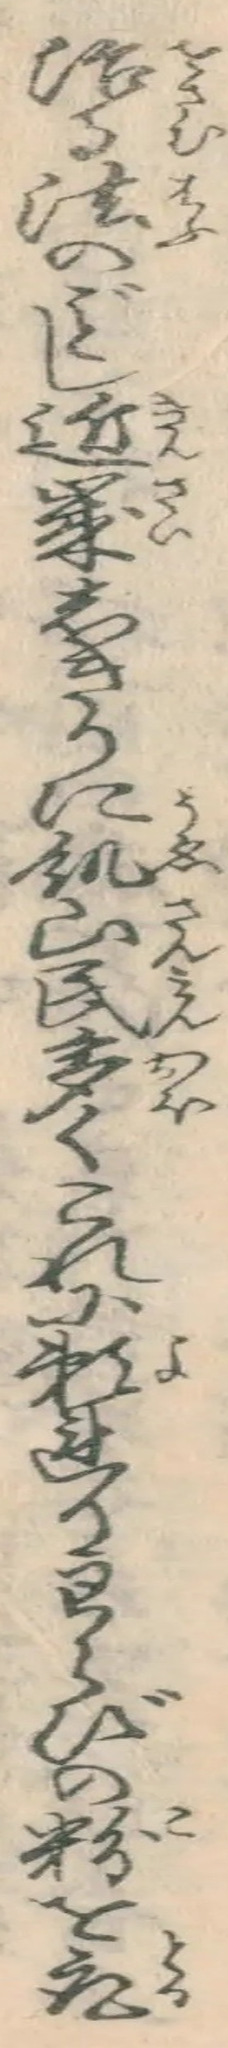治る法のごとし近歳しきりに飢山民多くこれに頼れりわらびの粉を取
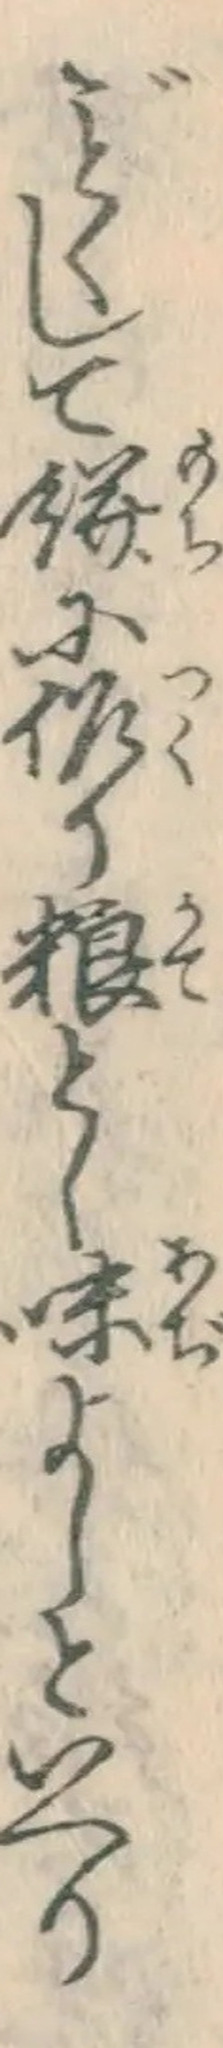ごとくして餅に作り粮とし味よしといへり
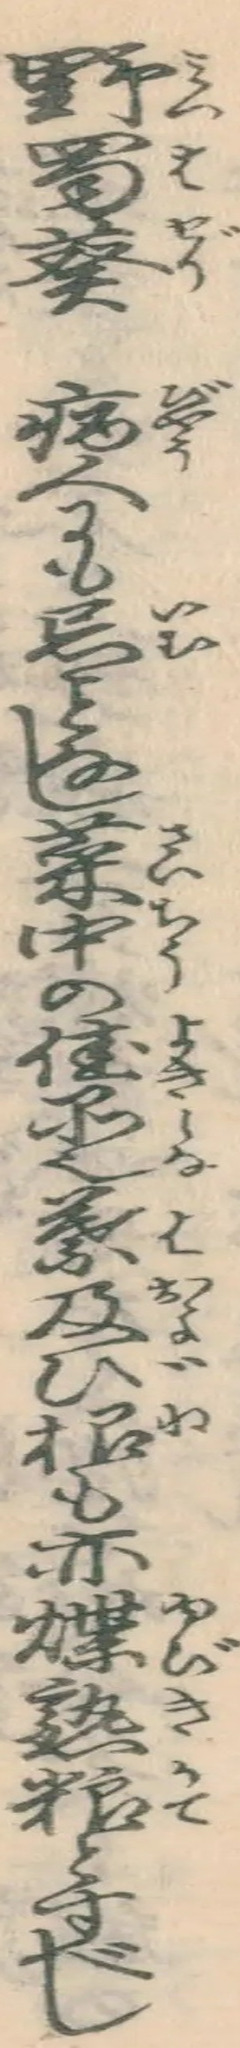野蜀葵病人にも忌ことなし菜中の佳品也葉及び根も亦煠熟粮とすべし

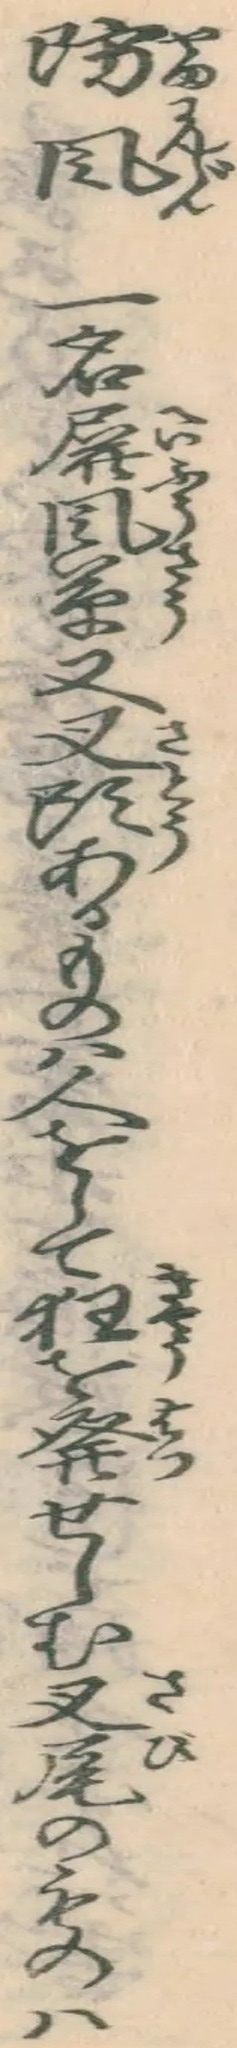防風一名屏風草又叉頭あるものは人をして狂を発せしむ叉尾のものは
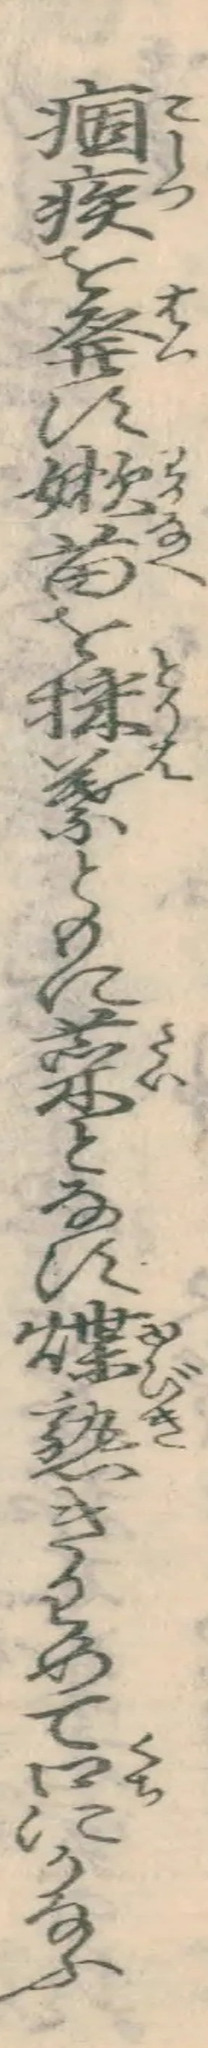痼疾を発す嫰苗を採葉ともに菜となす煠熟きわめて口にかなふ
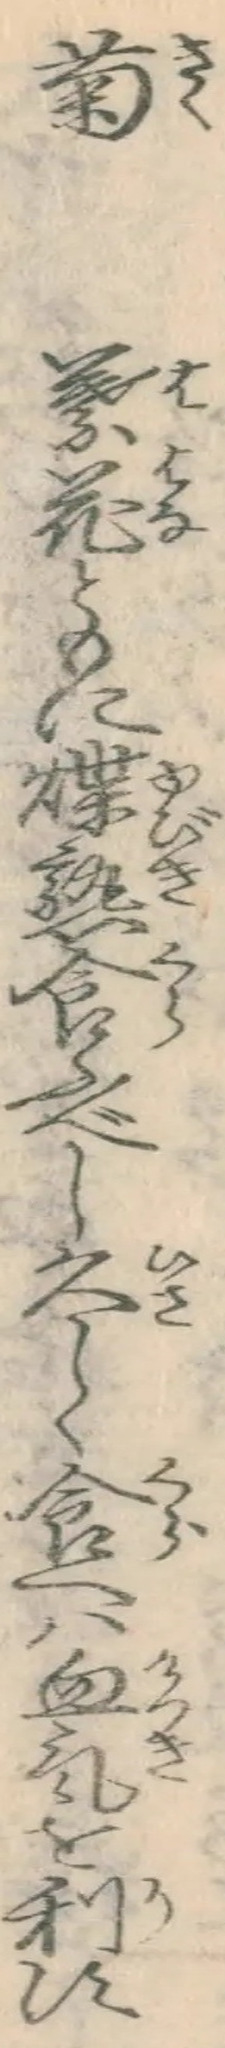菊葉花ともに煠熟食ふべし久しく食へは血気を利す
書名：経済をしへ草
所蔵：国立国会図書館 National Diet Library, JAPAN
